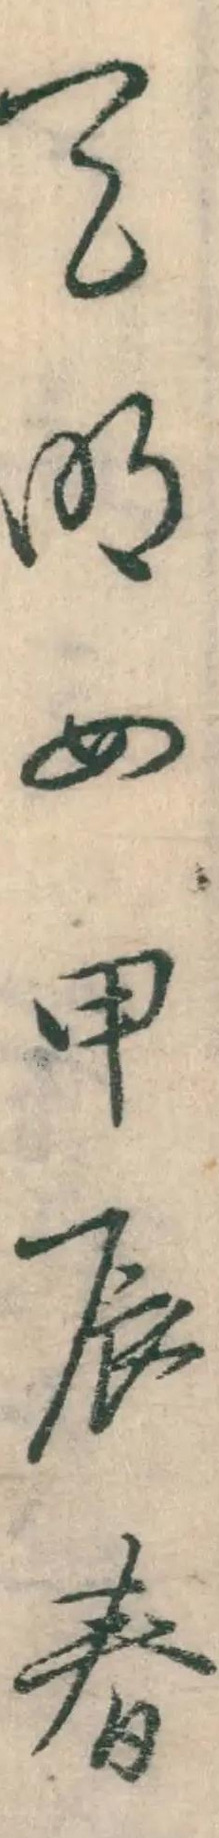天明四甲辰春
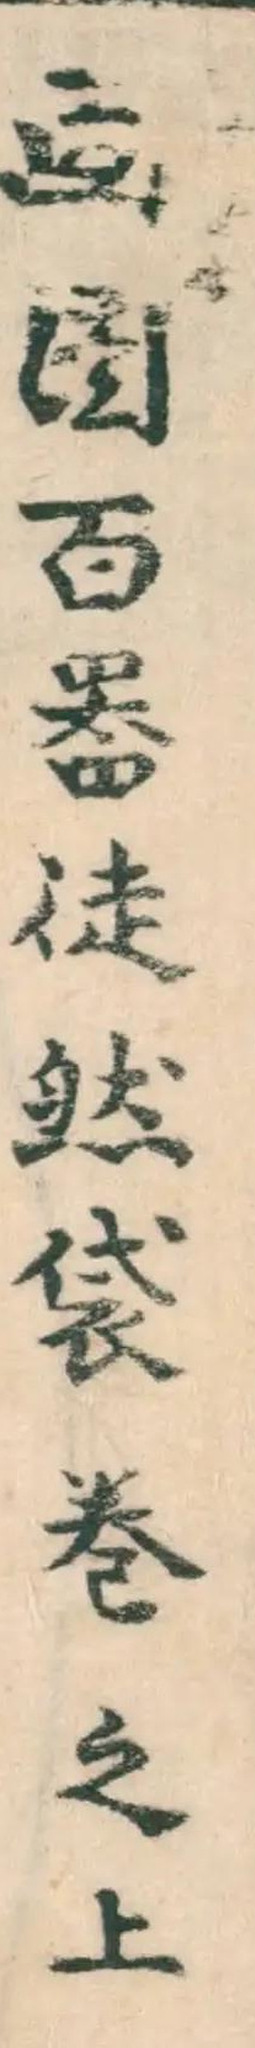画図百器徒然袋巻之上

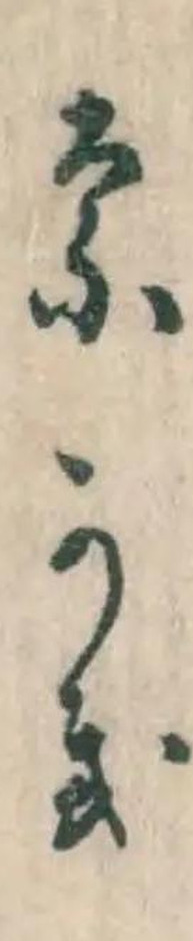なかき
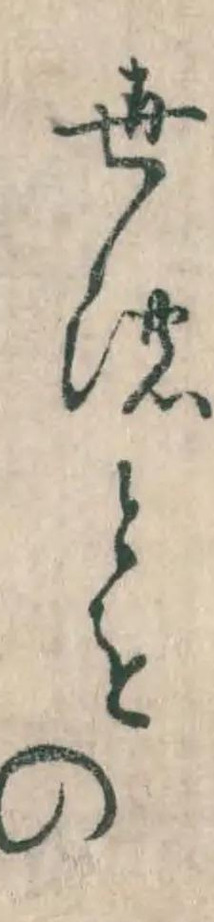世のとをの
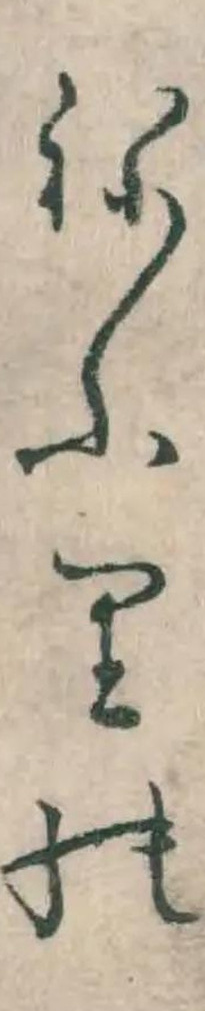ねふりの

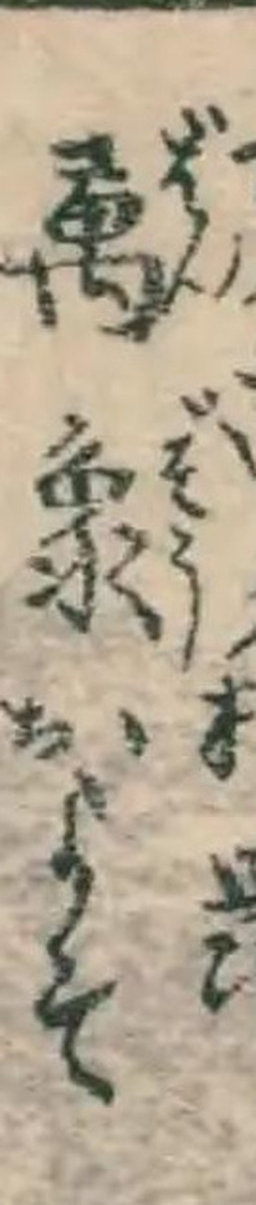萬象およそ
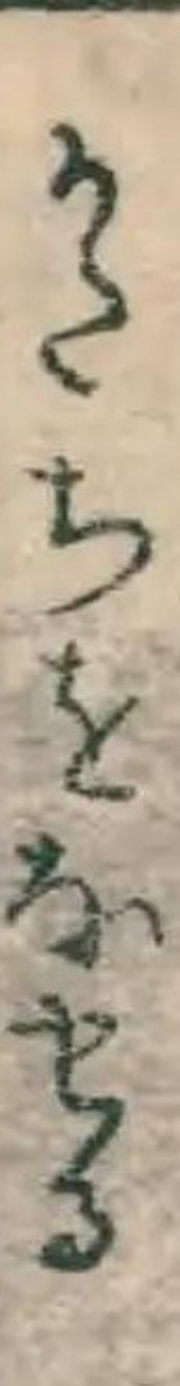かたちをなせる
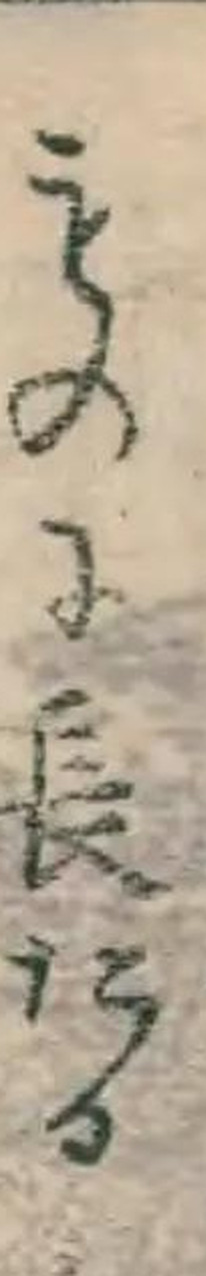ものに長たる
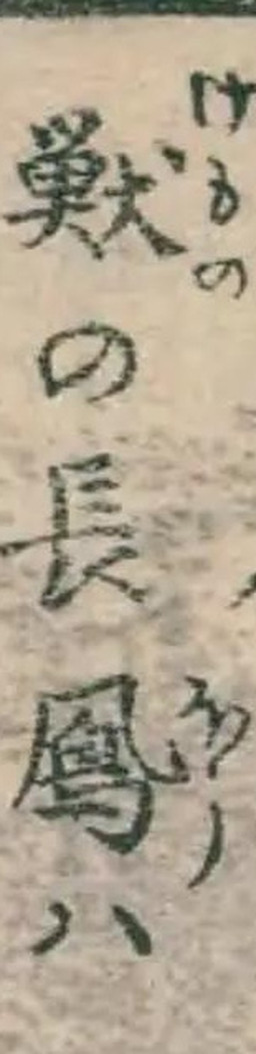獣の長鳳は
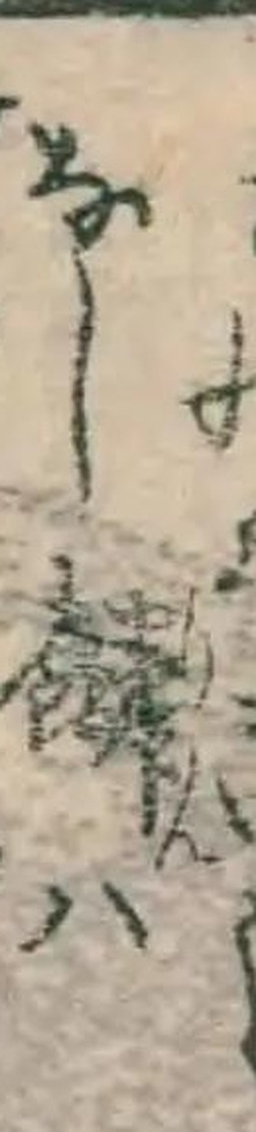なし麟は
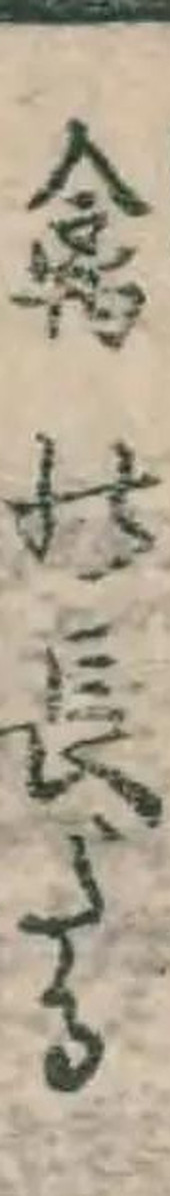禽の長たる
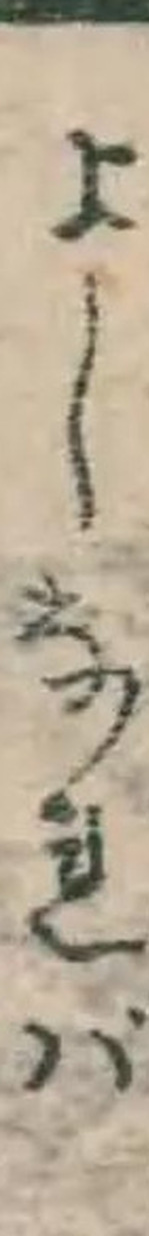よしなれば
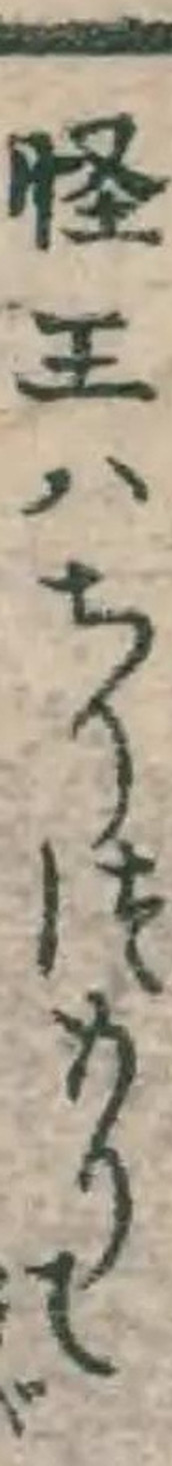怪王はちりつもりて
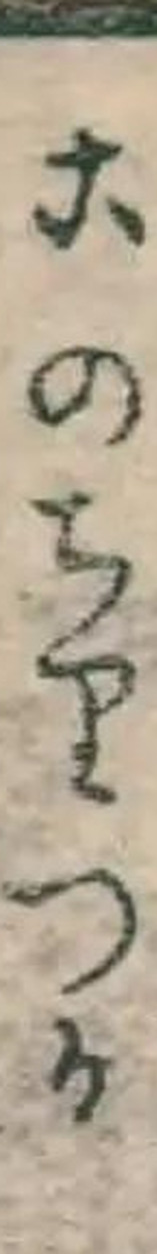このちりつか
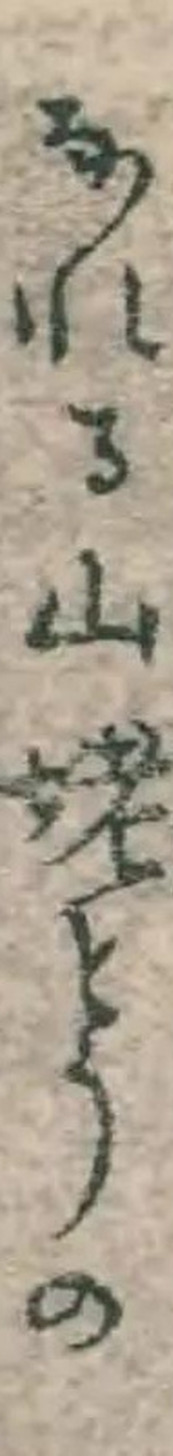なれる山姥とうの
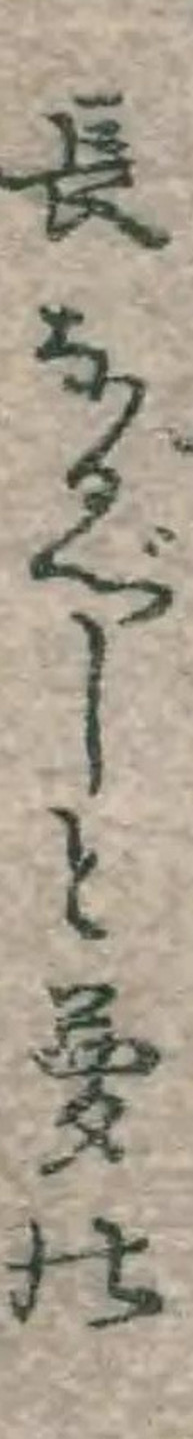長なるべしと夢の
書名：百鬼徒然袋 3巻. [1]
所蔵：国立国会図書館 National Diet Library, JAPAN
